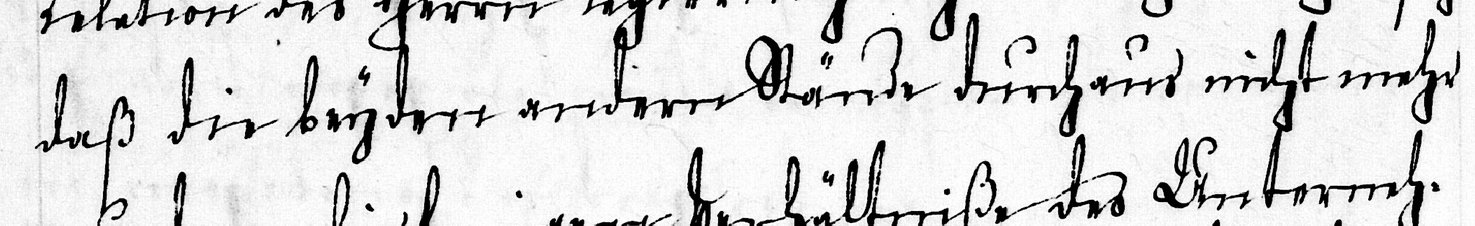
daß die beyden andern Stände durchaus nicht mehr
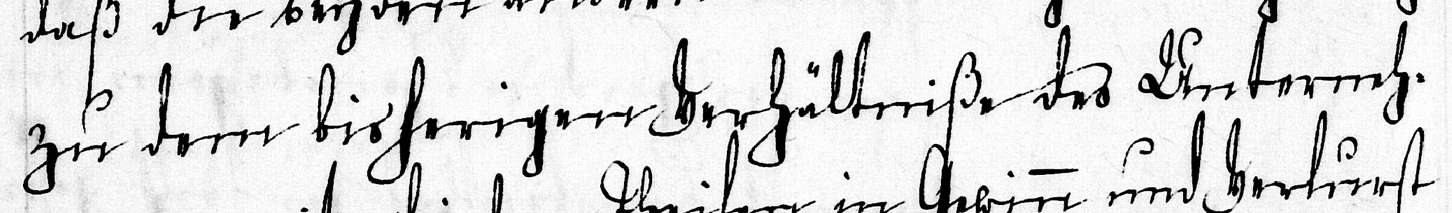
zu dem bisherigen Verhältniße des Unterneh¬
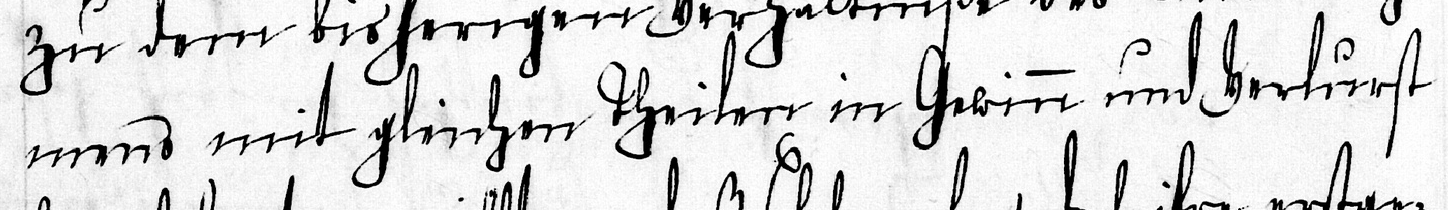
mens mit gleichen Theilen in Gewinn und Verlust
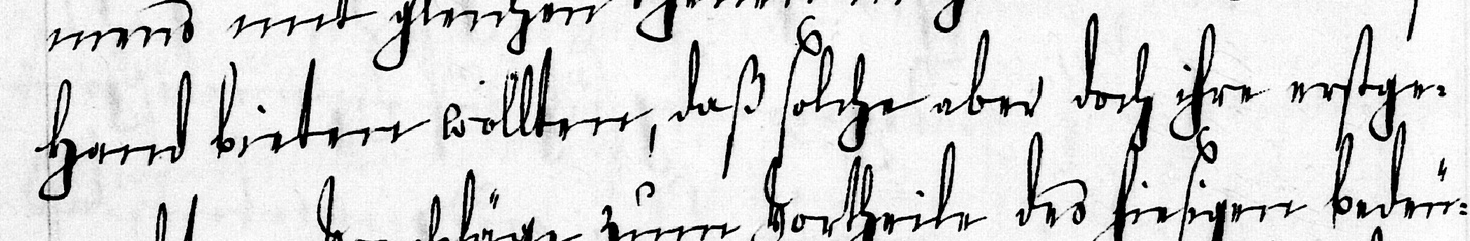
Hand bieten wollten, daß solche aber doch ihre erstge¬
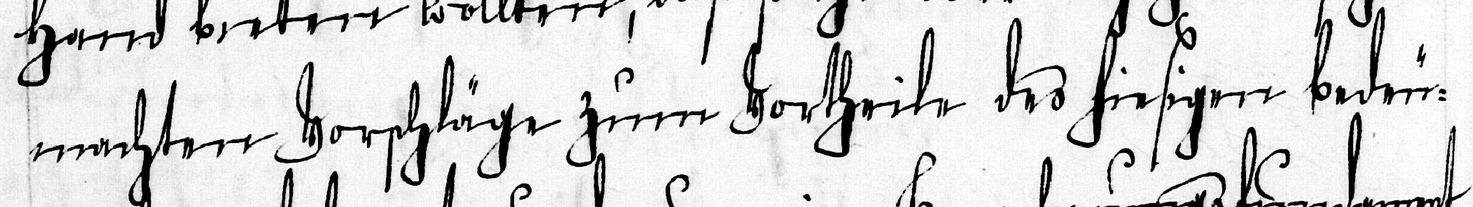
machten Vorschläge zum Vortheile des hiesigen bedeu¬
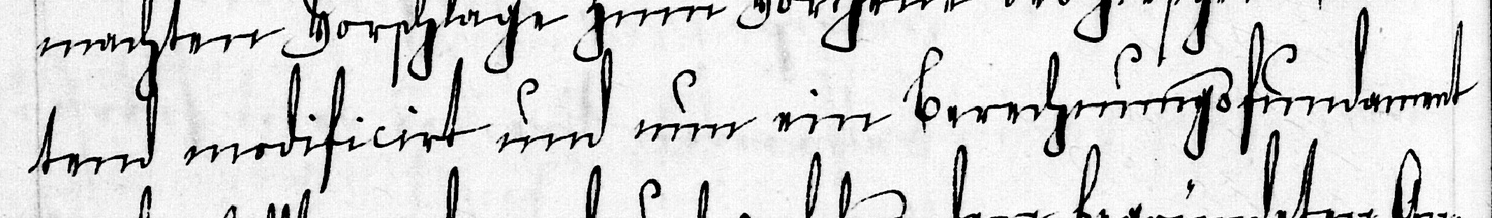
tend modificirt und nun ein Berechnungsfundament
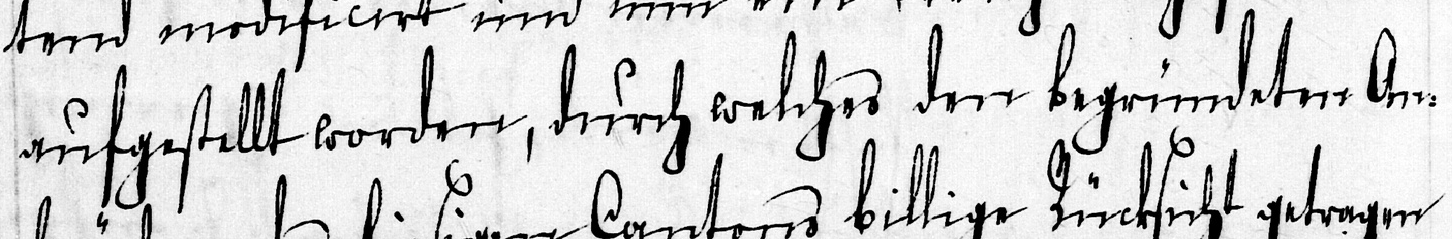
aufgestellt worden, durch welches den begründeten An¬
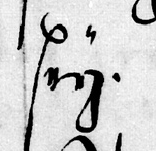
sey.
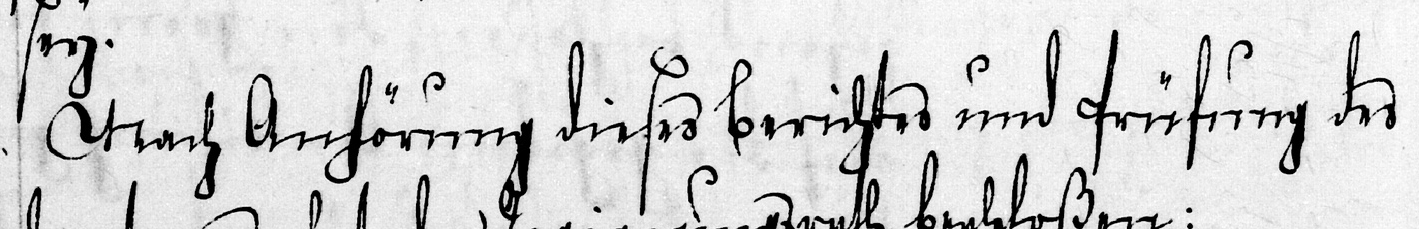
Nach Anhörung dieses Berichtes und Prüfung des
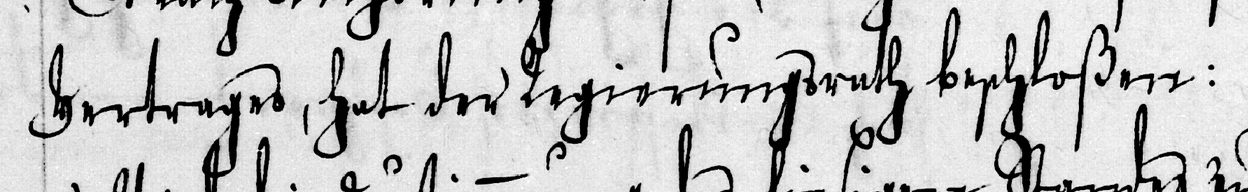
Vertrages, hat der Regierungsrath beschloßen:
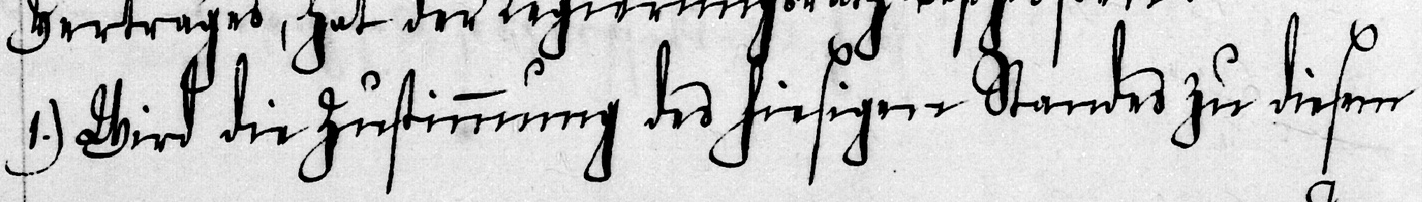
1.) Wird die Zustimmung des hiesigen Standes zu diesem
